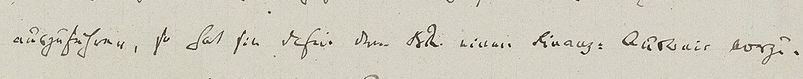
auszuführen, so hat sie dafür dem BR. einen Finanz-Ausweis vorzu-
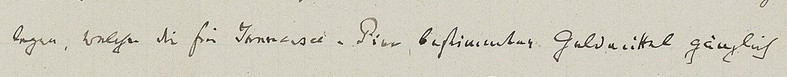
legen, welcher die für Immensee–Pino bestimmten Geldmittel gänzlich
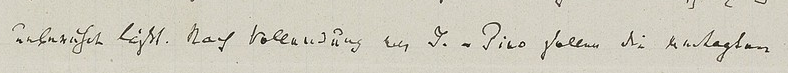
unberührt läßt. Nach Vollendung von I.–Pino sollen die vertagten
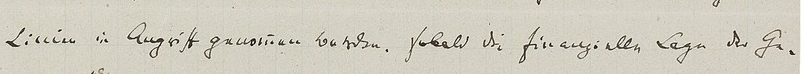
Linien in Angriff genommen werden. Sobald die finanzielle Lage der Ge-
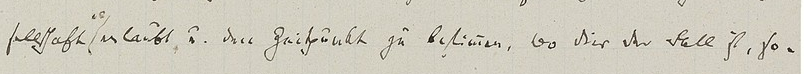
sellschaft es erlaubt, u. den Zeitpunkt zu bestimmen, wo dies der Fall ist, so-
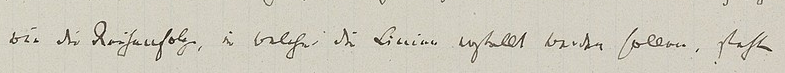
wie die Reihenfolge, in welcher die Linien erstellt werden sollen, steht
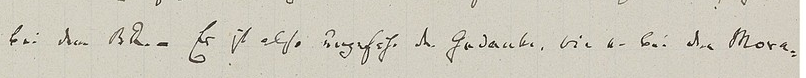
bei dem BR. – Es ist also ungefähr der Gedanke, wie er bei den Mora-
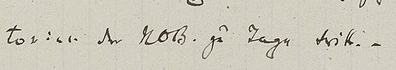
torien der NOB. zu Tage tritt. –
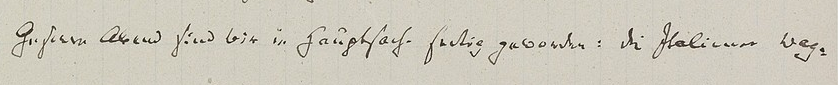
Gestern Abend sind wir in Hauptsache fertig geworden: die Italiener wag-
